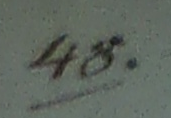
48.
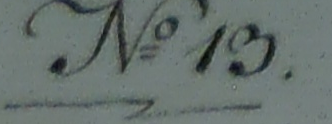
No͇ 13.
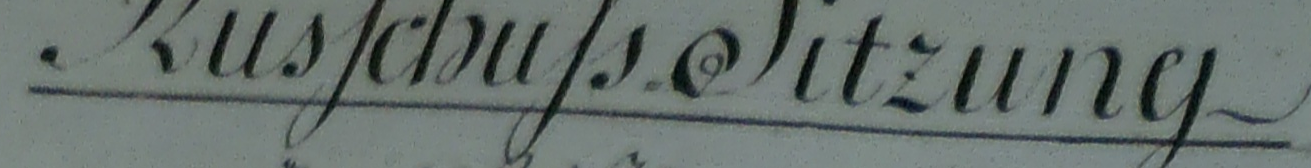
Ausschuss‗Sitzung
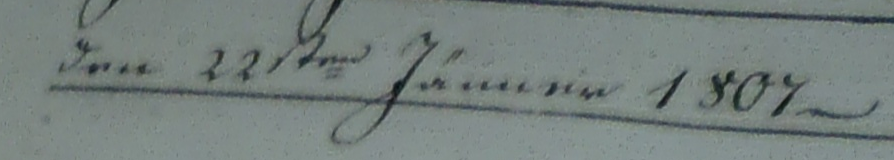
den 22ste͇n Jänner 1807.
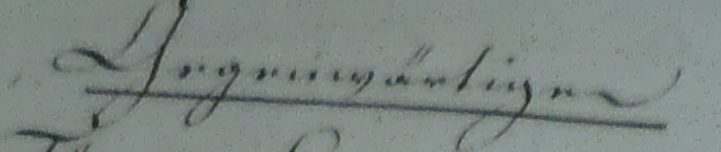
Gegenwärtige
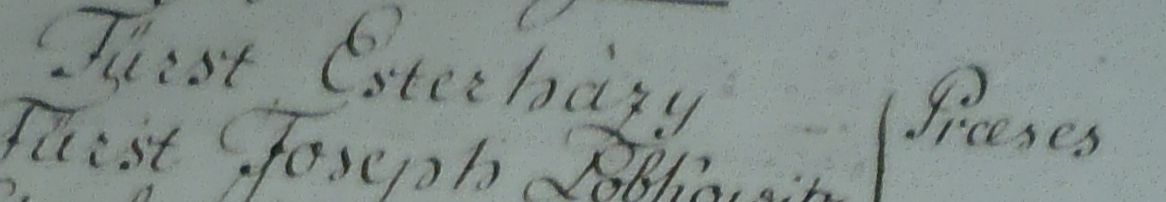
Fürst Esterhàzy Præses
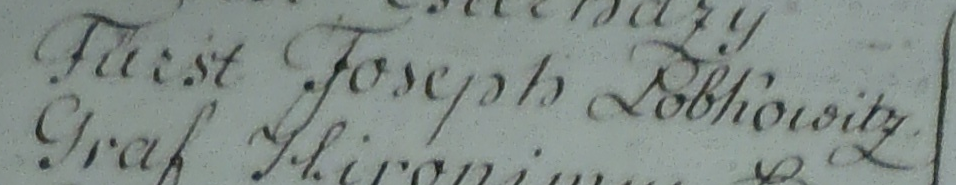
Fürst Joseph Lobkowitz.
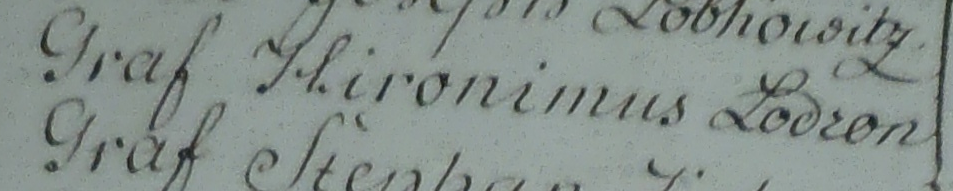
Graf Hironimus Lodron
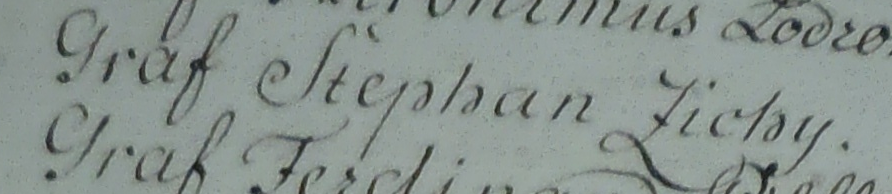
Graf Stephan Zichy.
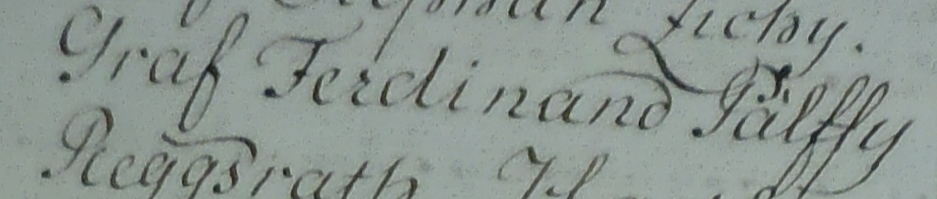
Graf Ferdinand Pàlffy
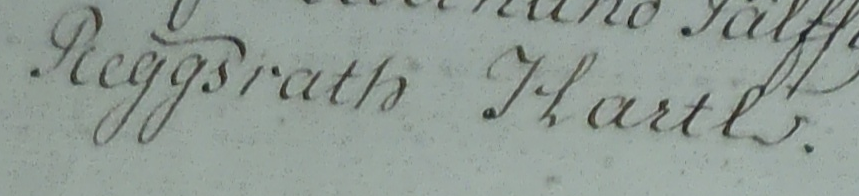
Reg͞gsrath Hartl.
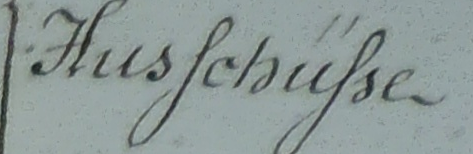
Ausschüsse
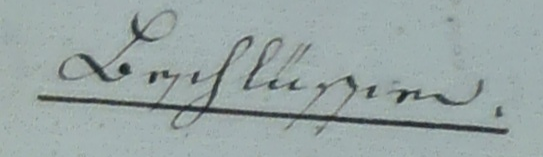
Beschlüsse.
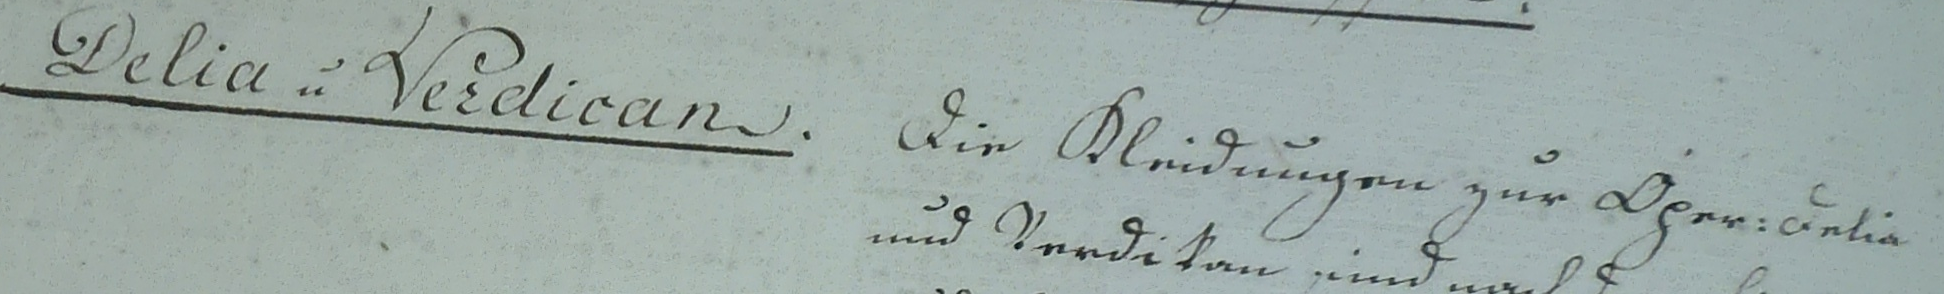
Delia u Verdican. Die Kleidungen zur Oper: Delia
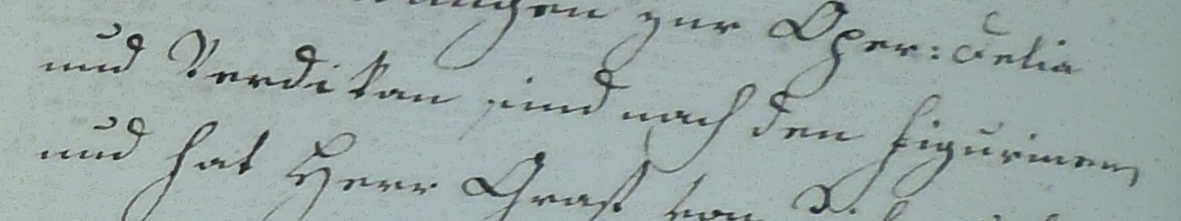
und Verdikan sind nach den Figurinem
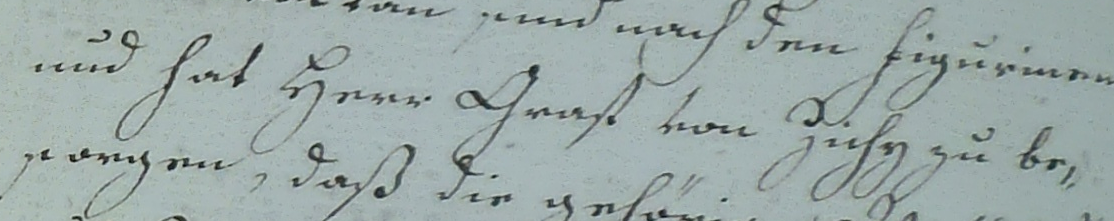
und hat Herr Graf von Zichy zu be¬
